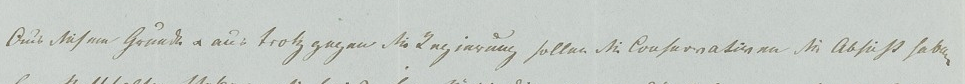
Aus diesem Grunde & aus Trotz gegen die Regierung sollen die Conservativen die Absicht haben
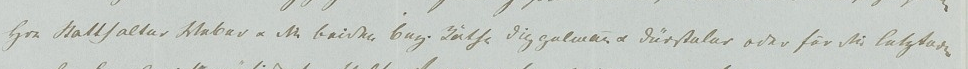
Hrn Statthalter Weber & die beiden Bez.Räthe Diggelmann & Dürsteler oder für die letztern
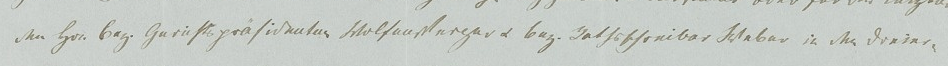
den Hr. Bez.Gerichtspräsidenten Wolfensperger & Bez.Rathsschreiber Weber in den Dreier-
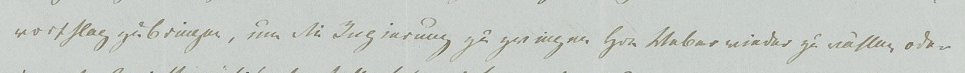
vorschlag zubringen, um die Regierung zu zwingen Hrn Weber wieder zu wählen oder
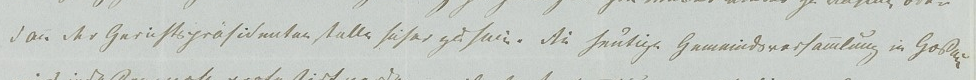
dann der Gerichtspräsidentenstelle sicher zu sein. Die heutige Gemeindsversammlung in Goßau
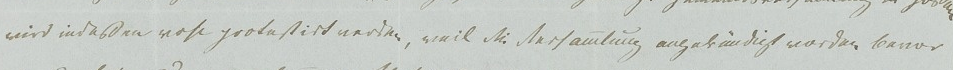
wird indessen wohl protestirt werden, weil die Versammlung angekündigt worden bevor
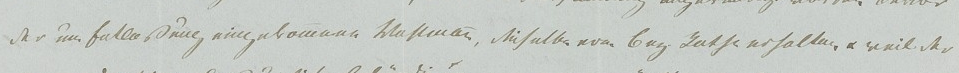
der um Entlassung eingekommene Wahlmann, dieselbe vom Bez.Rathe erhalten, & weil der
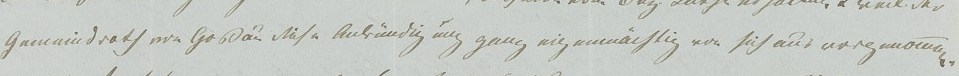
Gemeindrath von Goßau diese Ankündigung ganz eigenmächtig von sich aus vorgenommen,
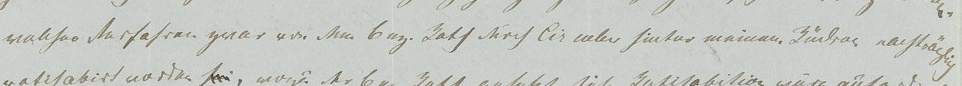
welches Verfahren zwar von dem Bez.Rath durch Circular hinter meinem Rücken nachträglich
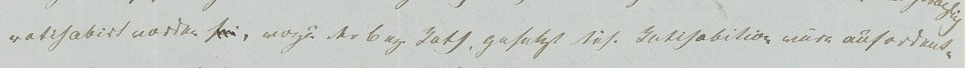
ratihabirt worden sei, wozu der Bez.Rath, gesetzt diese. Ratihabition wäre auf ordent-
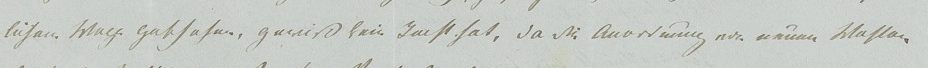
lichem Wege geschehen, gewiß kein Recht hat, da die Anordnung von neuen Wahlen
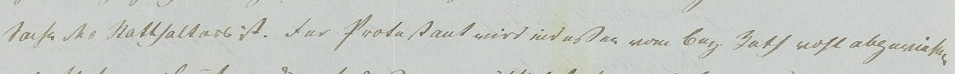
Sache des Statthalters ist. Der Protestant wird indessen vom Bez.Rath wohl abgewiesen
